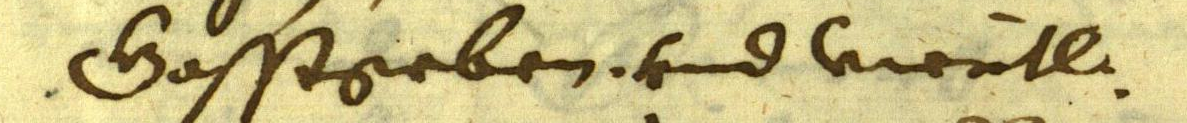Gasstgeben. vnd viertl¬
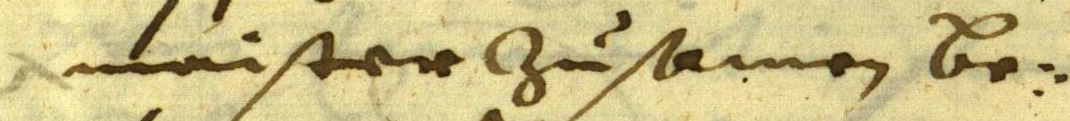maister Zūsamen be¬
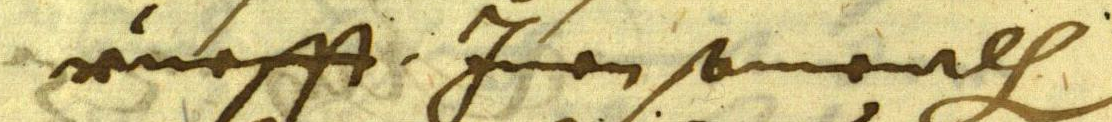rūefft. Inen samentlich
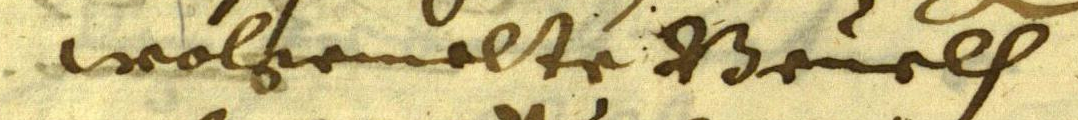wolgemelte Beūelh
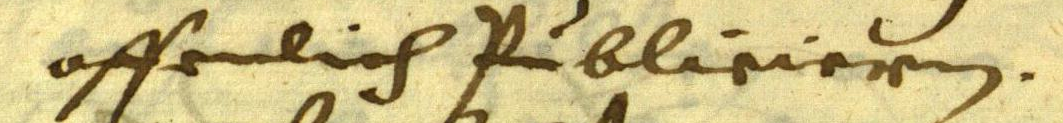offenlich Pūbliciern.
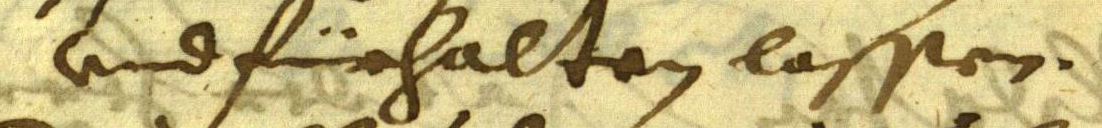vnd fürhalten lassen.
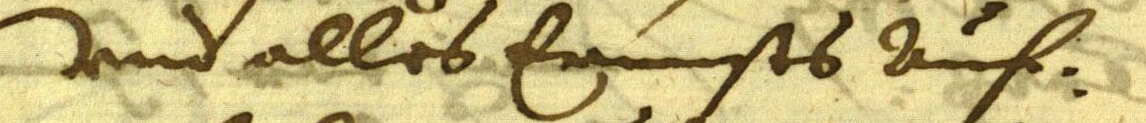Vnd alles Ernnsts Aūf¬
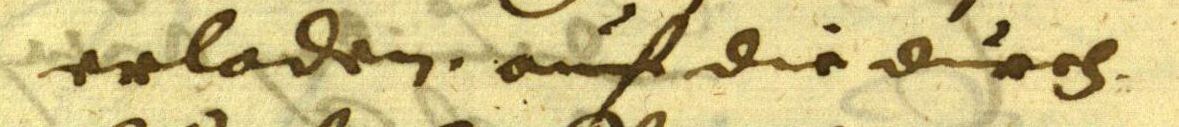erladen. aūf die dūrch
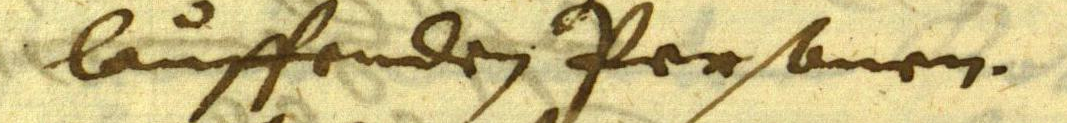laūffenden Personen.
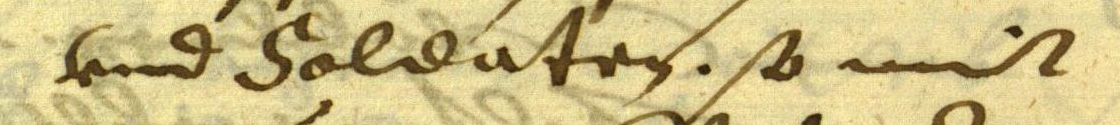vnd Soldaten. so mit
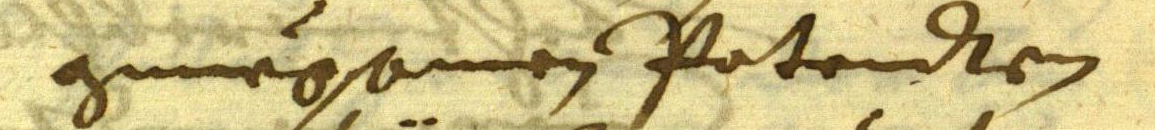gnūegsamen Patendten
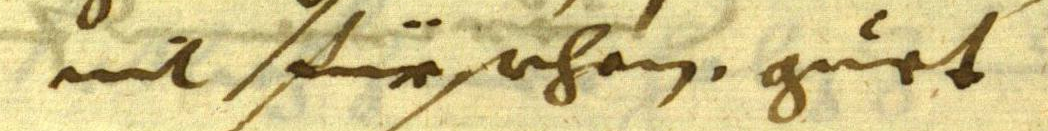nit fürsehen. gūet
